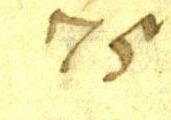75
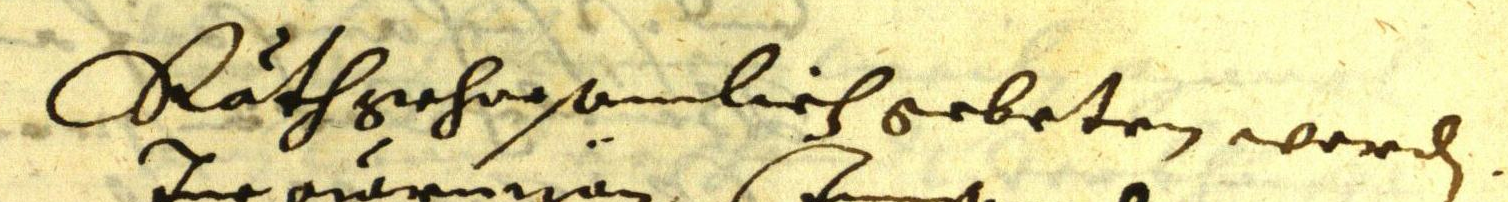Rāth gehorsamlich gebeten werd
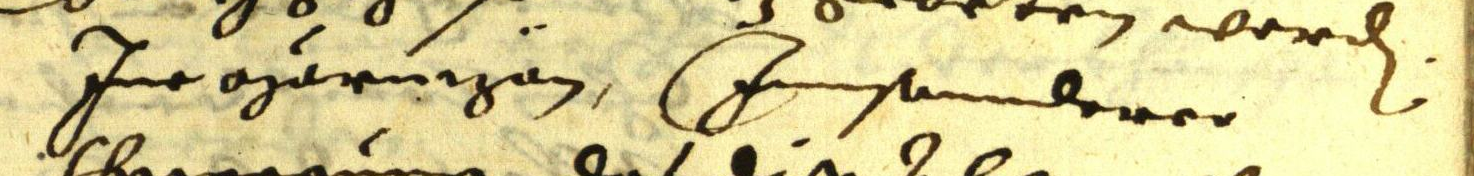Ine Mārnzän, Innsbesonnderer
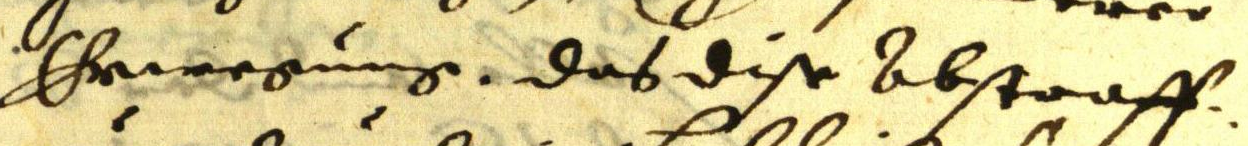Erwegūng. das dise Abstraff¬
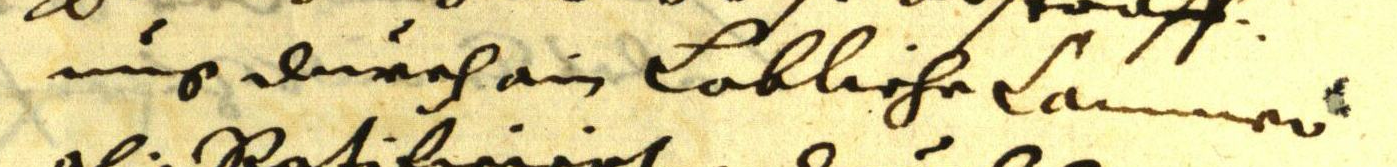ūng dūrch ain Lobliche Cammer
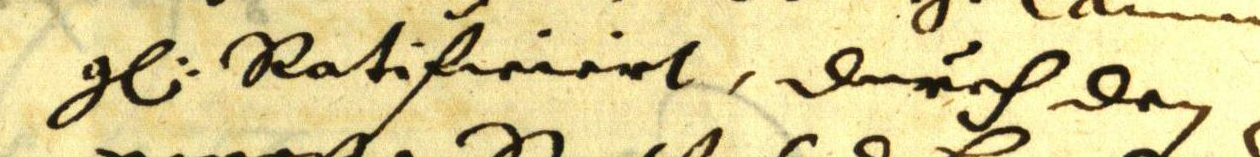g: Ratificiert, dūrch den
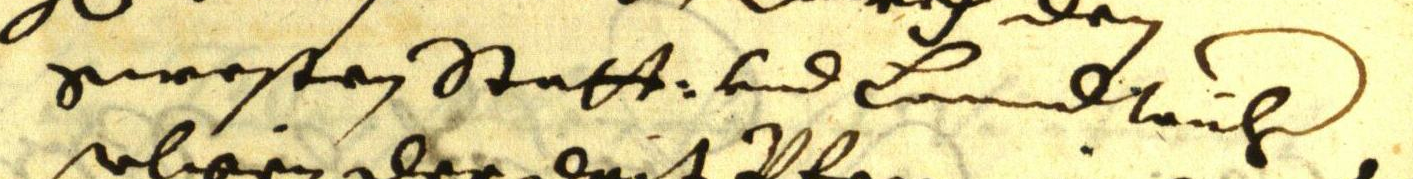gwesten Statt: vnd Lanndtrich
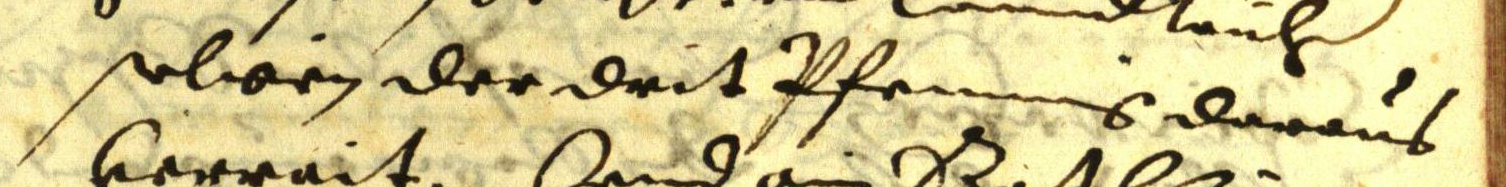seligen der drit Pfennig daraūs
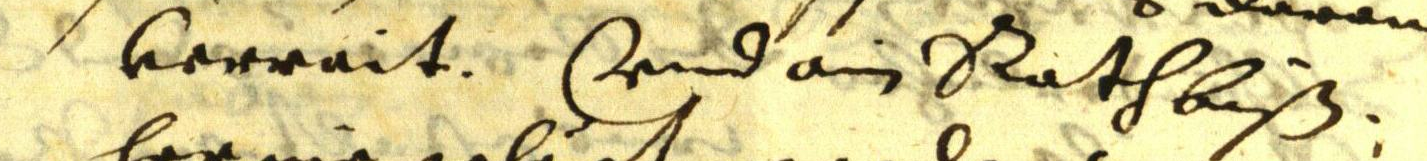verrait. Vnd ain Rath biß¬
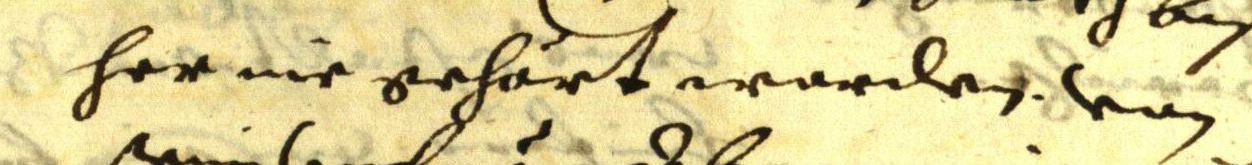her nie gehōrt worden. von
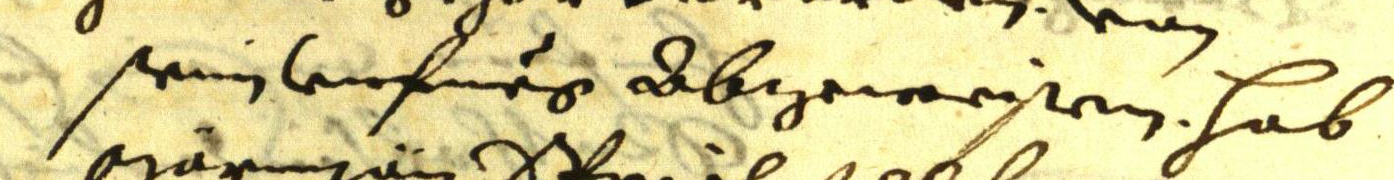sein vnfūeg Abzeweisen. Hab
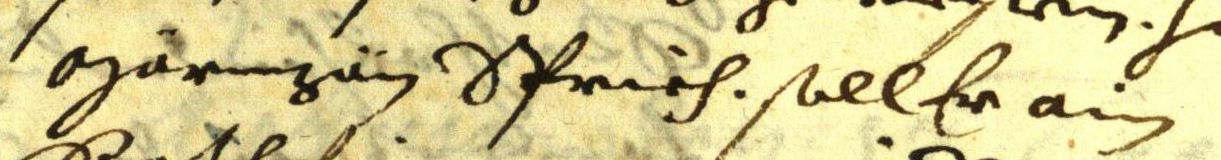Märnzän Sprich. soll Er ain
